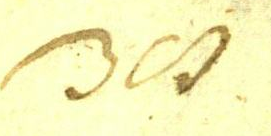38
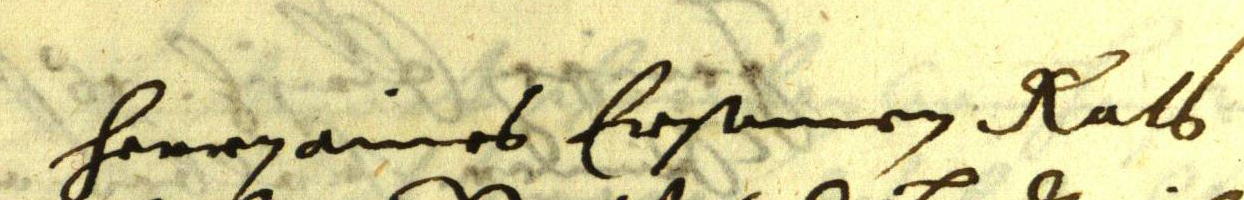herrn aines Ersamen Rats.
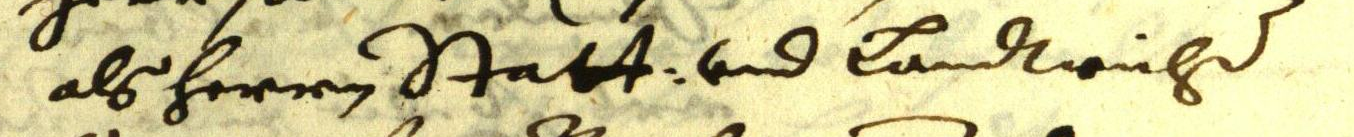als herrn Statt: vnd Landtricht
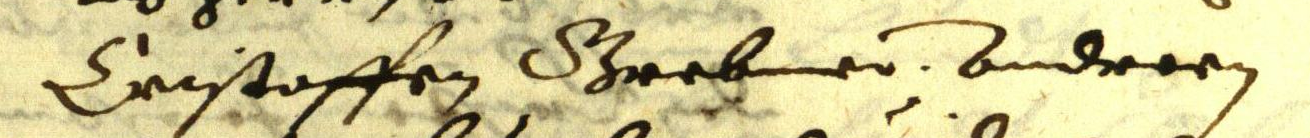Cristoffen Grebmer. Andreen
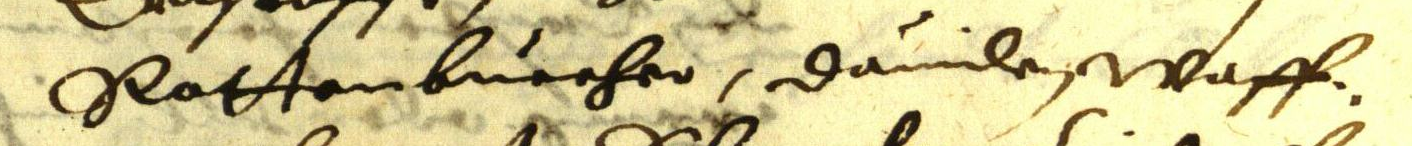Rottenbūecher, Daūiden Waff¬
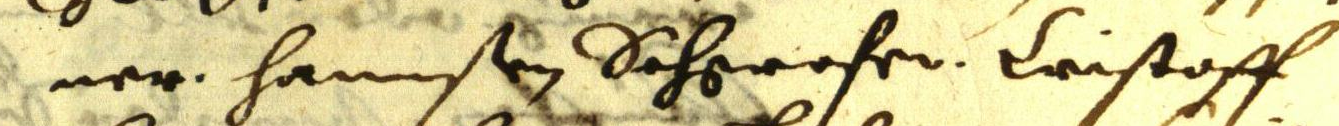ner. hannsen Schgrafer. Cristoff
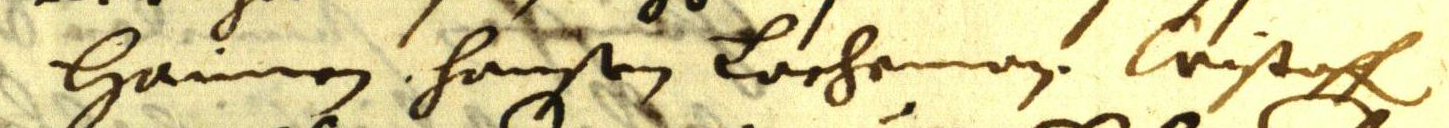Haimen. hansen Locheman. Cristoff
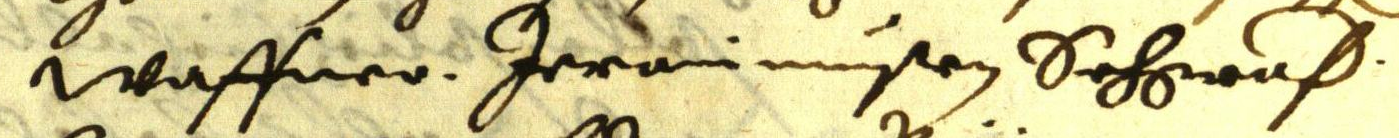Waffner. Jeronimūsen Schgraf
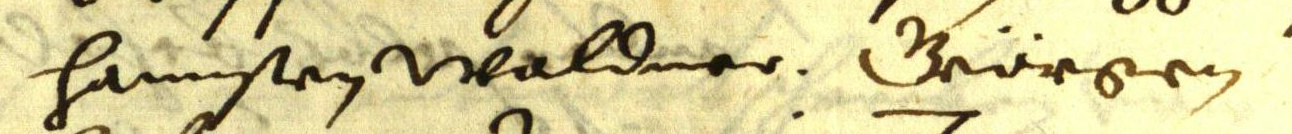hannsen Waldner. Geörgen
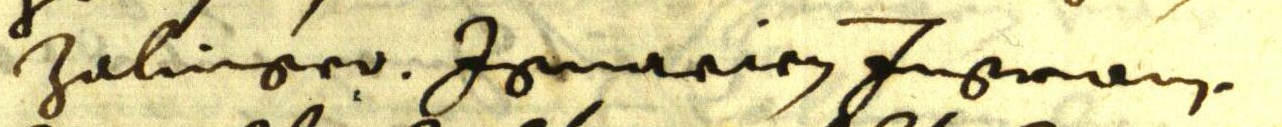Zalinger. Ignacien Ingram.
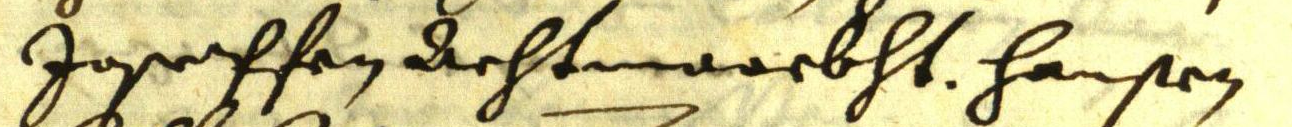Joseffen Achtmarckht. hansen
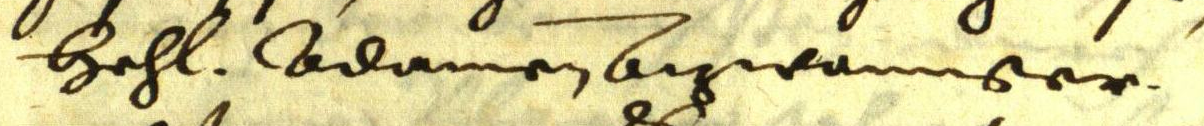Hehl. Adamen Azwannger.
